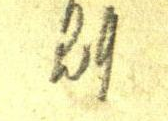29
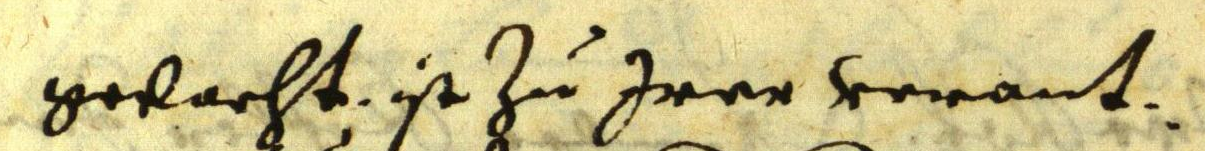gedacht. ist Zū Irer verant¬
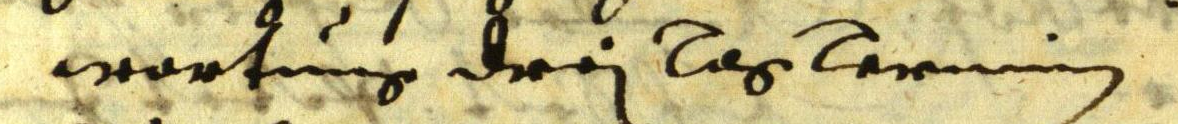wortūng drei Tag Termin
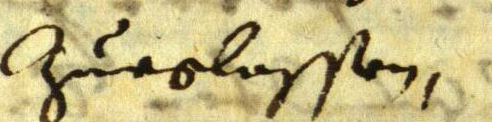Zūeglassen,
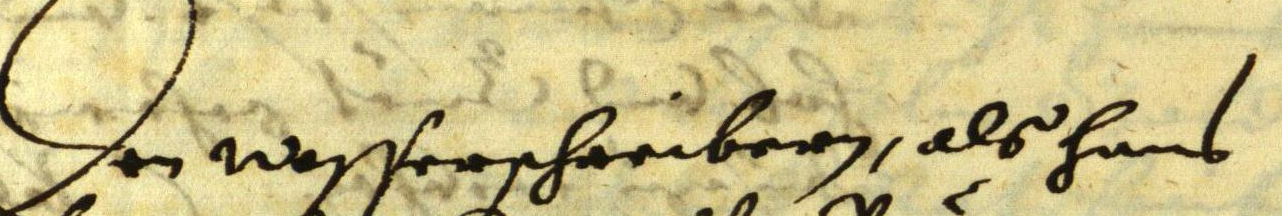Den Wasserschreibern, als hans
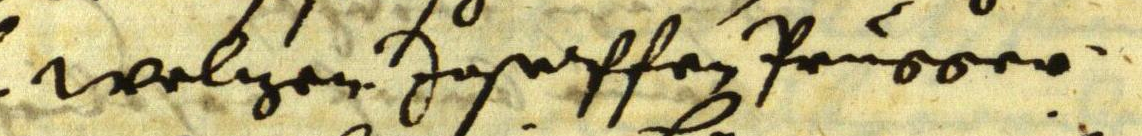Weltzer. Joseffen Prūgger.
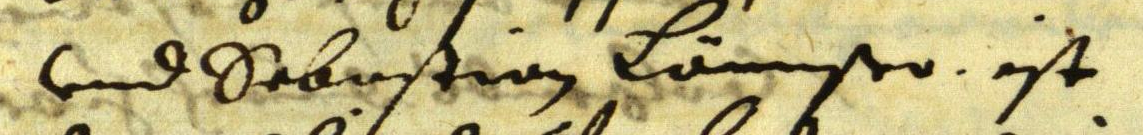vnd Sebastian Lännser. ist
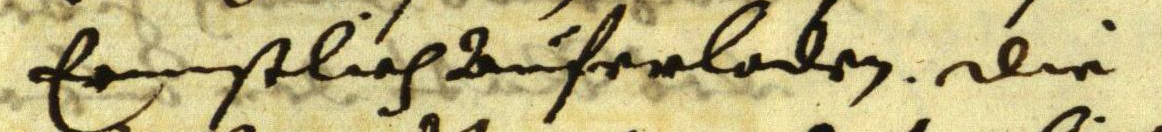Ernnstlich Aūferladen. die
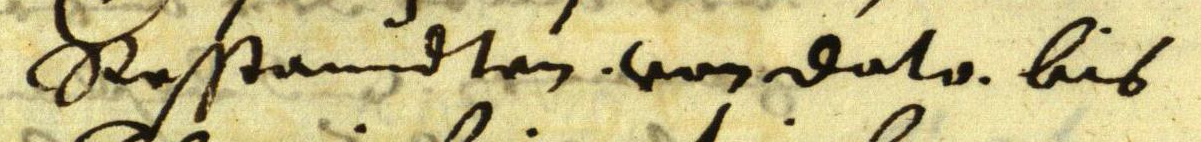Resstanndten von dato bis
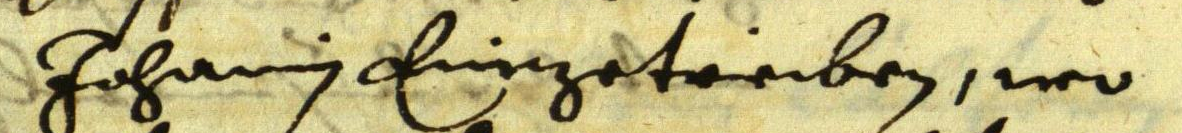Johannj Einzetreiben, wen
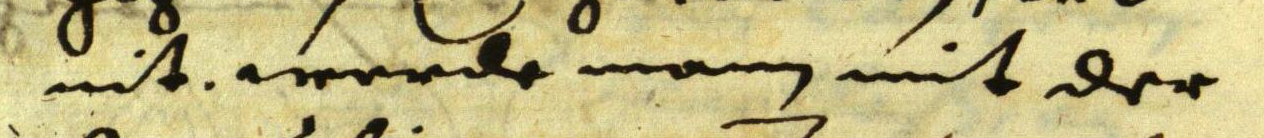nit. werde mann mit der
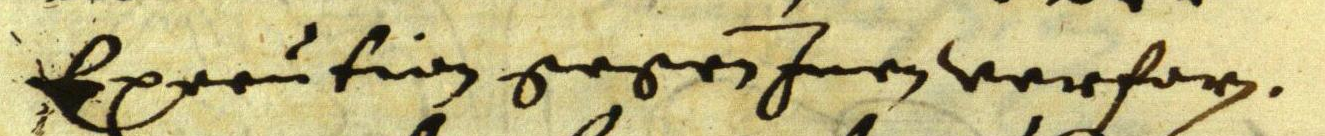Execūtion gegen Inen verfarn.
